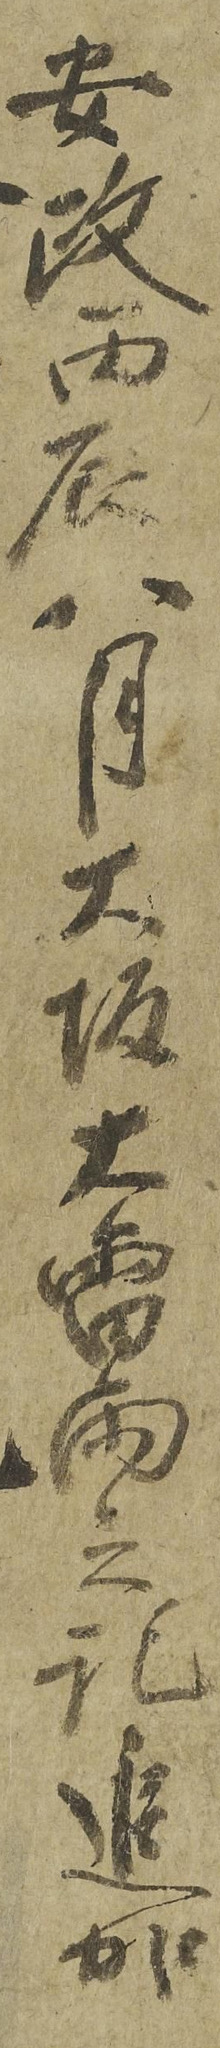安政丙辰八月大坂大雷雨之記追加
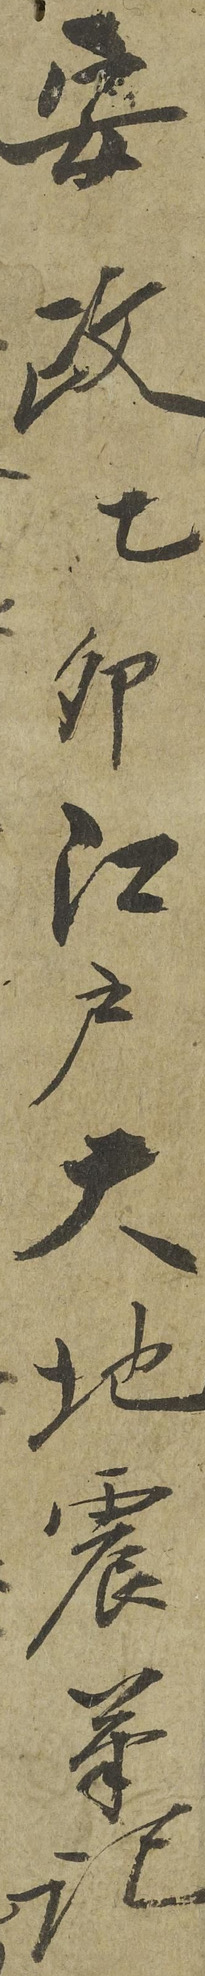安政乙卯江戸大地震筆記
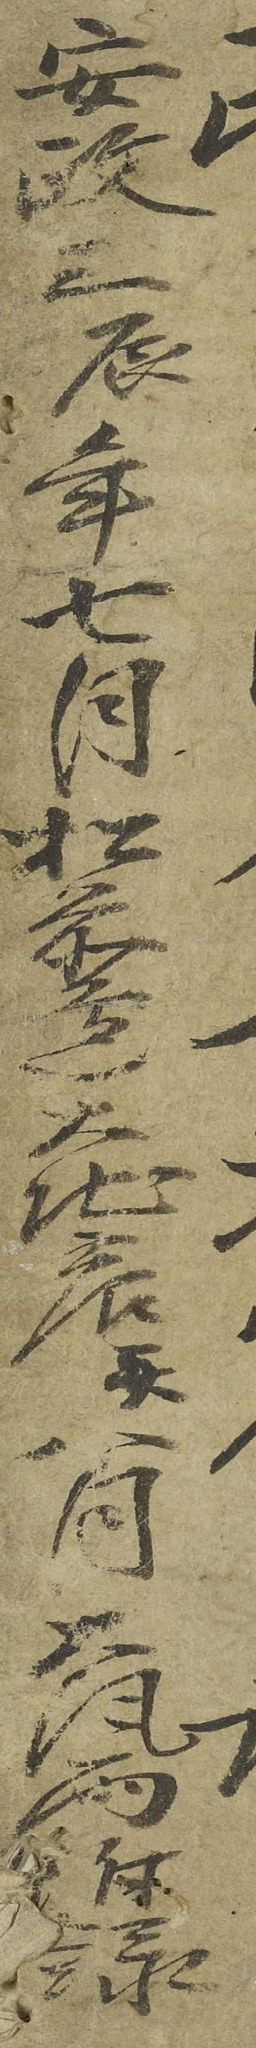安政三辰年七月松前辺大地震并八月大風雨附録

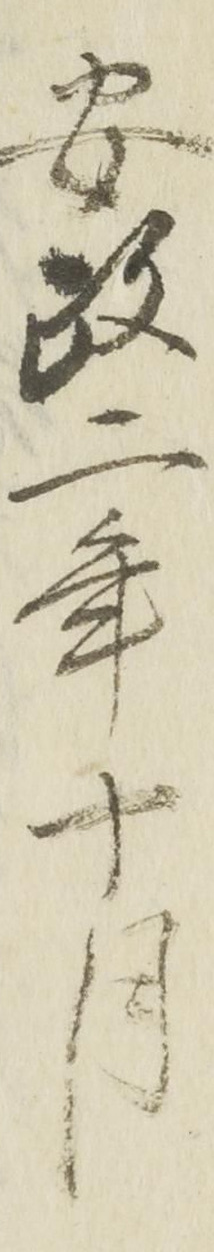安政二年十月
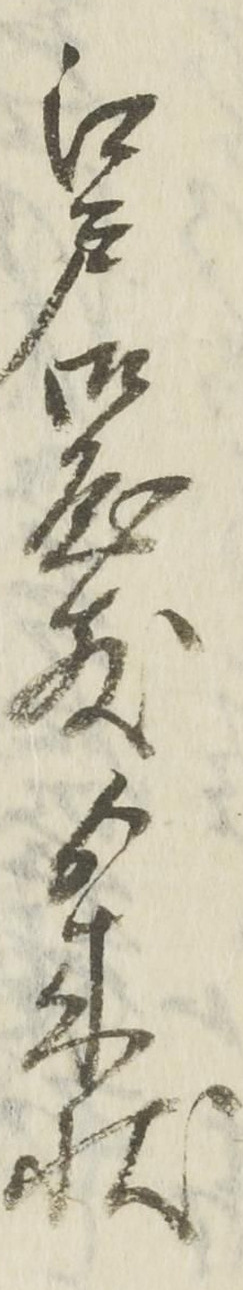江戸御屋敷ゟ来状
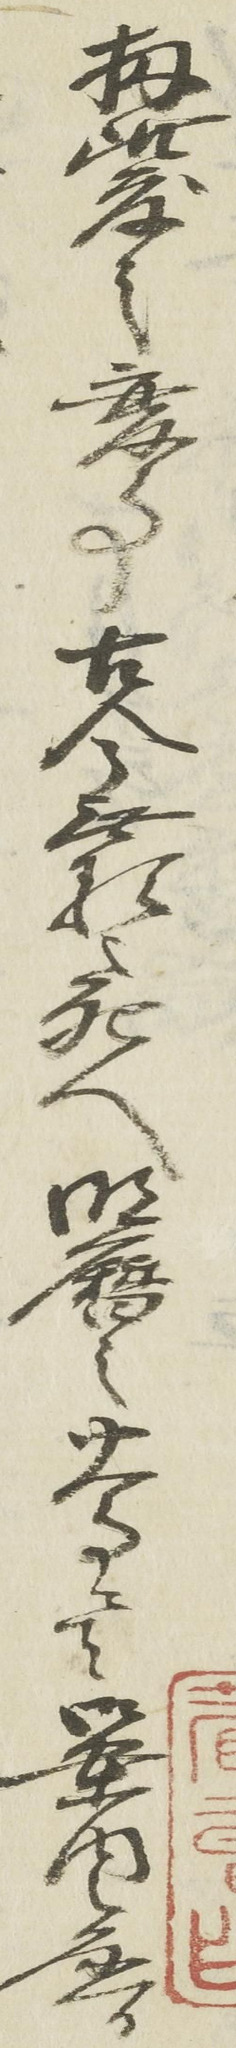扨此度之変事古今無類之死人明暦之火事ニは御案内之通り
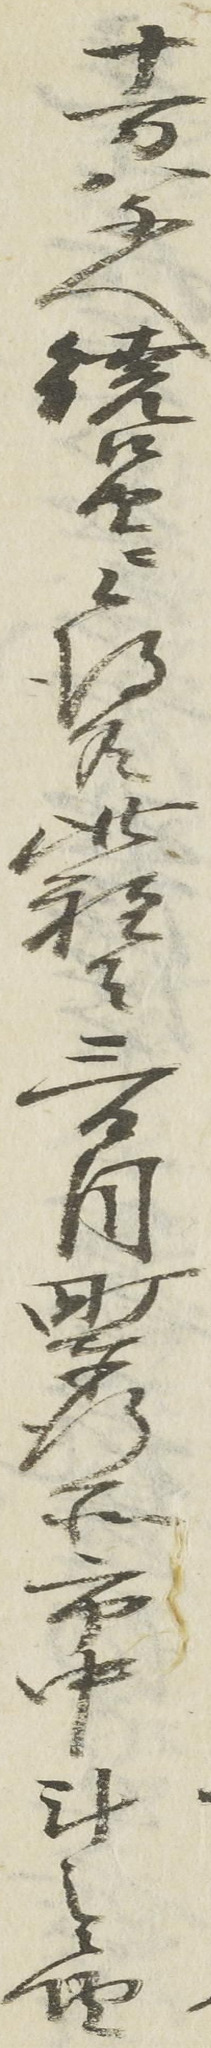十万八千人焼候由ニ候得共此程は三日内町奉行所市中斗之届
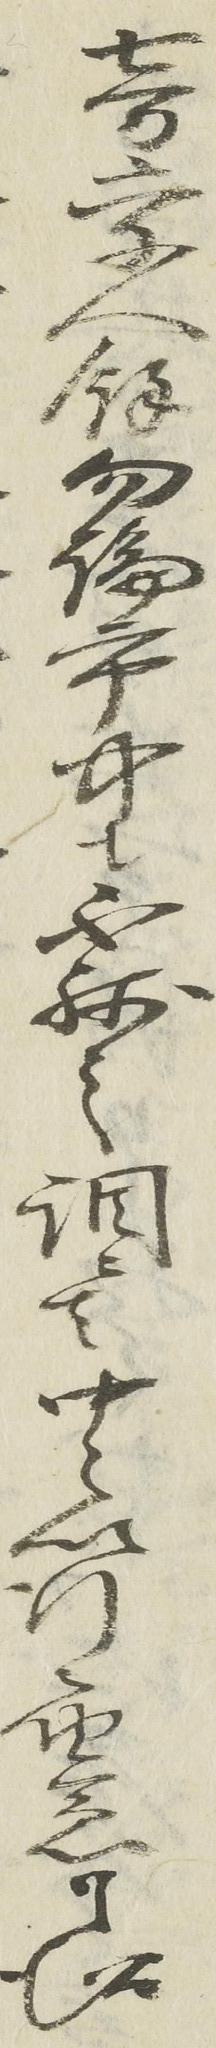七万六千人余勿論市中も不残之調ニは中々以行届兼候趣
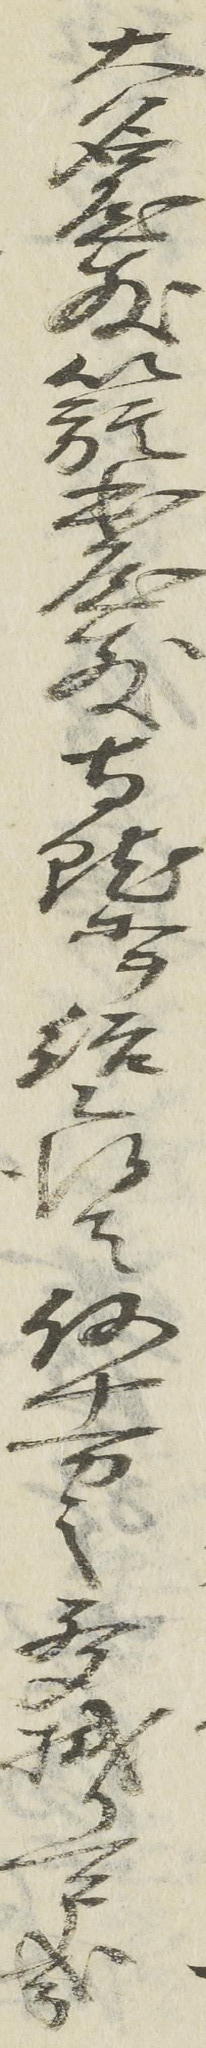大名屋敷籏本屋敷寺院等ヲ結候得は何十万之声掛り可申哉
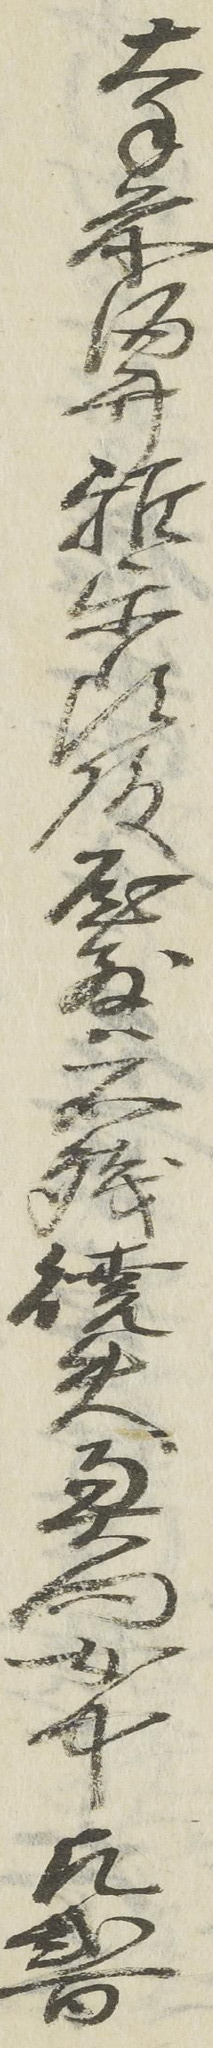大手前酒井雅楽頭殿屋敷は不残焼失奥向女中凡弐百
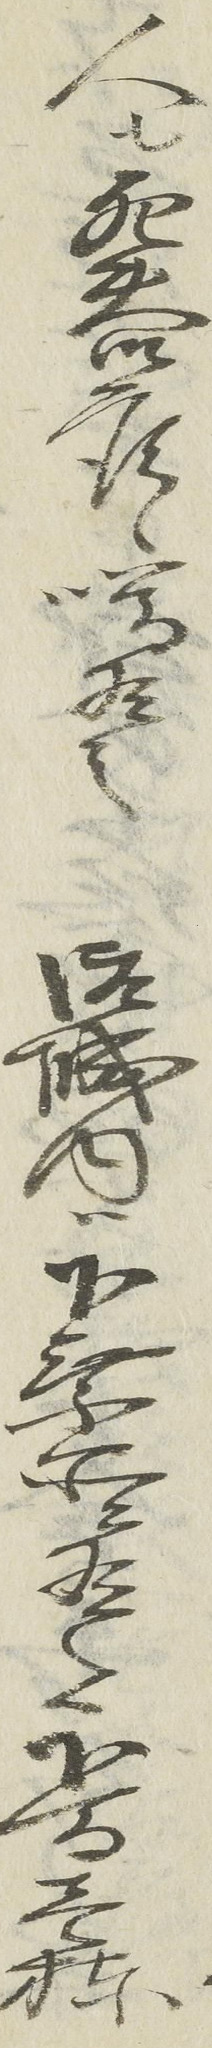人も死失御座候噂有之御城内ハ下乗所ニ有候へ下馬壱棟
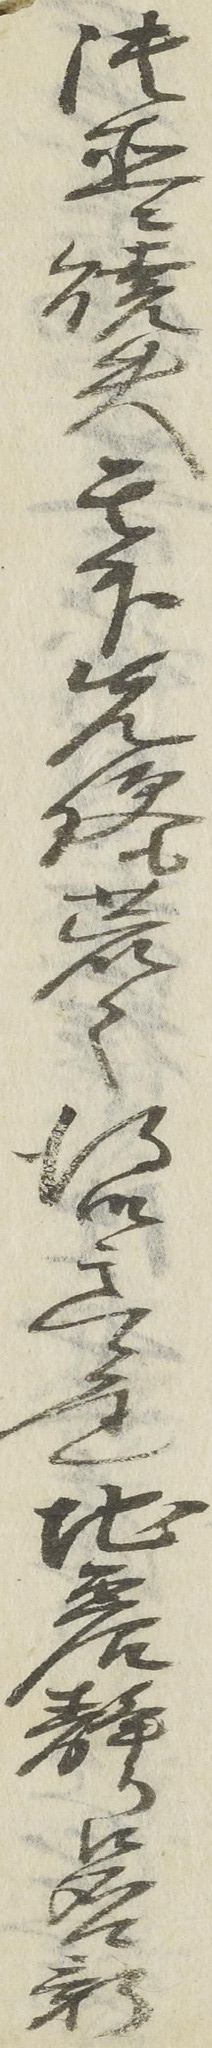潰直ニ焼失其外先便も荒々得御意候通地震静り候否新
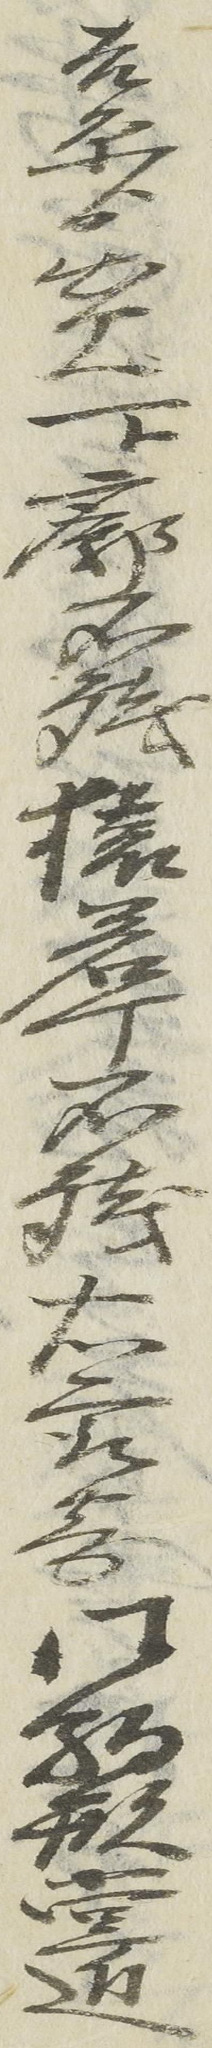吉原ゟ出火下廓不残猿若丁不残右最寄同駒形堂近
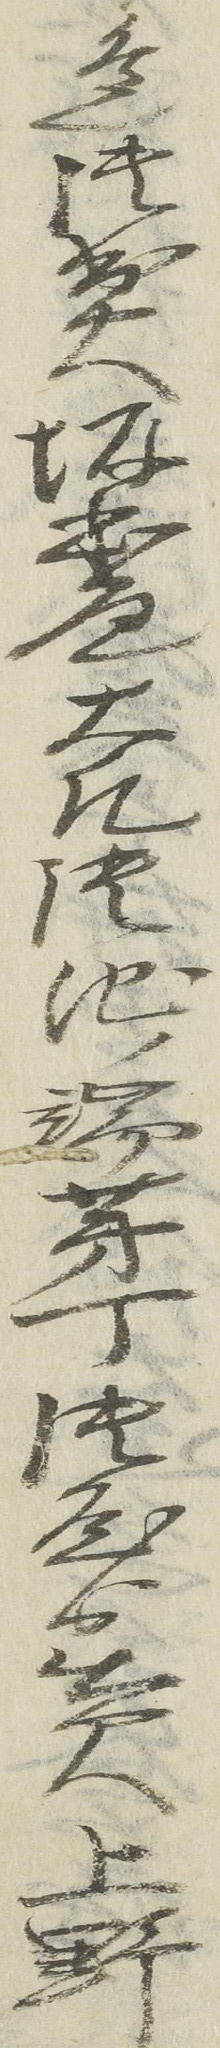辺潰出火坂本通大凡潰池ノ端茅丁潰屋ゟ出火上野

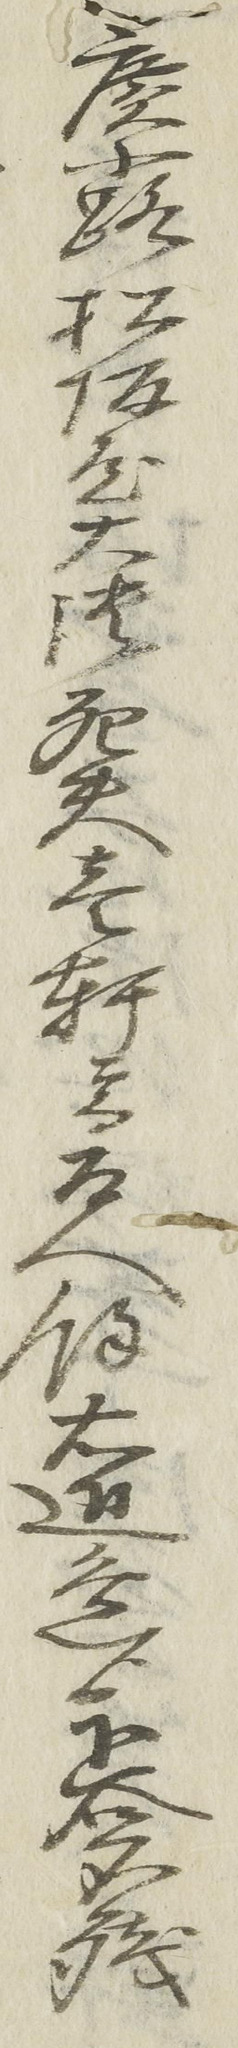廣小路松坂屋御大潰死失壱軒二而百人餘右近辺ゟ下谷不残
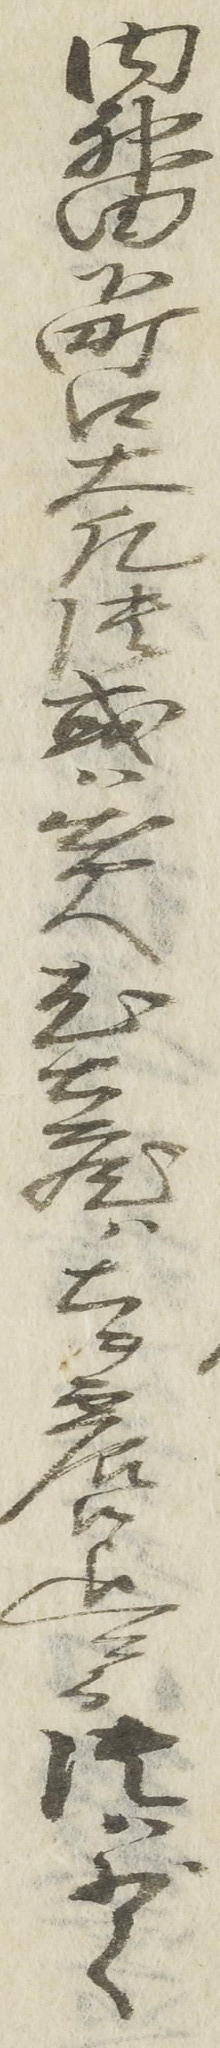内神田下町口大凡潰或ハ出火尤土蔵ハ土ヲ震候迄二而潰ハ少く
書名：安政乙卯江戸大地震筆記　安政丙辰八月大阪大雷雨之記追加　安政三辰年七月松前辺大地震并八月大風雨記録
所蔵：東京大学地震研究所図書室 Earthquake Research Institute Library, The University of Tokyo, JAPAN
